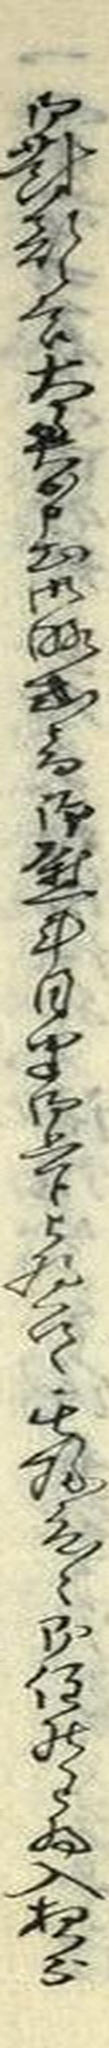御対顔之節大奥ゟ申出御略式ニ而御熨斗目半御上下被為召候其余度々御住居へ被為入夜分
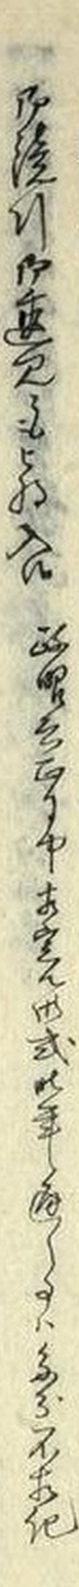御鏡引御透見ニも被為入候政昭言正月中相定ル御式昨年之通之事ハ多分不相記
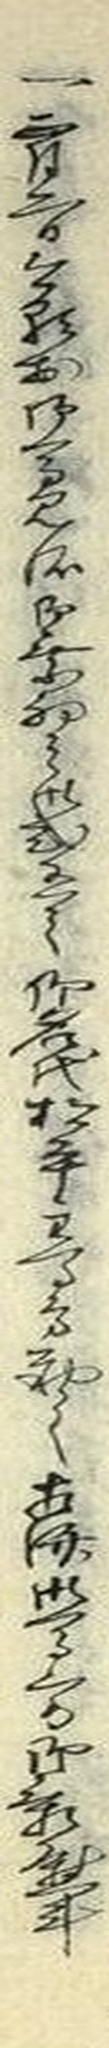一正月二日今朝於御馬見所御乗初之御式有之御名代松平主馬方勤之相済於馬方御影熨斗
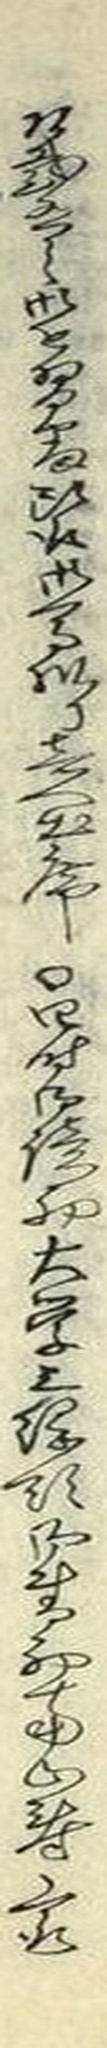頂戴有之御近習番頭取御馬掛り壱人出席〇四時御読初大学三綱領御書初南山寿最
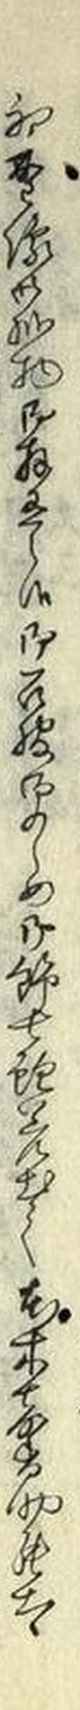初聖像御掛物御拝有之候御召服御のしめ御飾長鮑差出之花木馨助罷出仕候
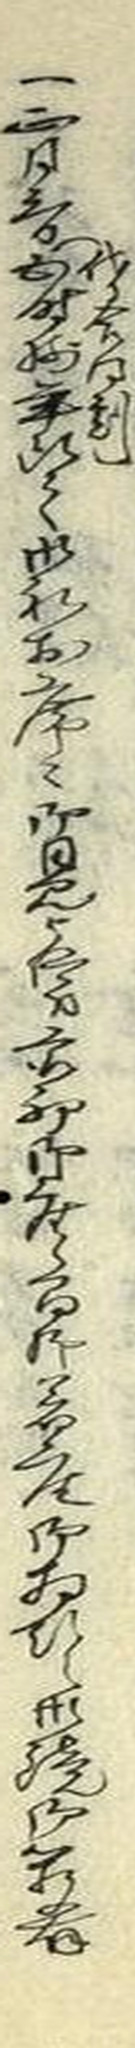一正月三日五時揃代り合同刻年頭之御礼於席々御目見被仰付最初御座之間御着座御拝領之御鏡御箱肴
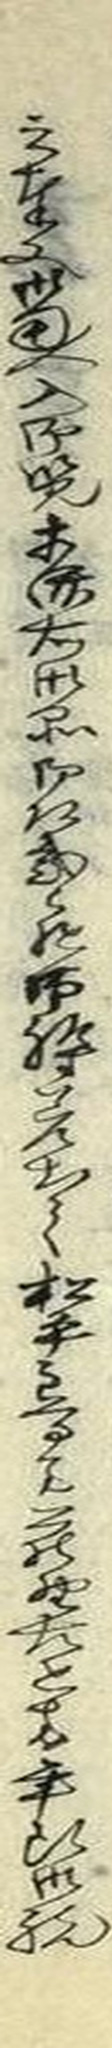之奉文御用人入御覧相済右御品御頂戴被遊御褥差出之松平主馬方荻野左近方年頭御祝
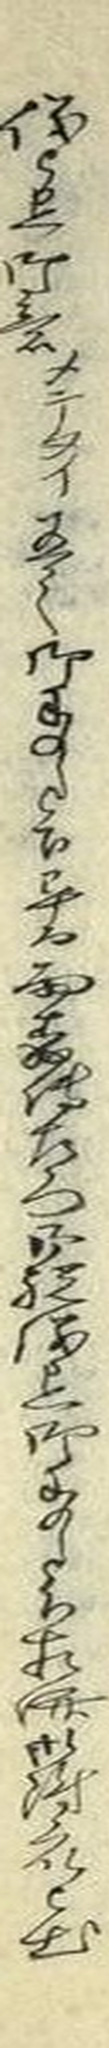儀被申上御意メテタイ有之御手のし被下畢而雨森伝左衛門御祝儀申上御手のし被下相済御附衆被出
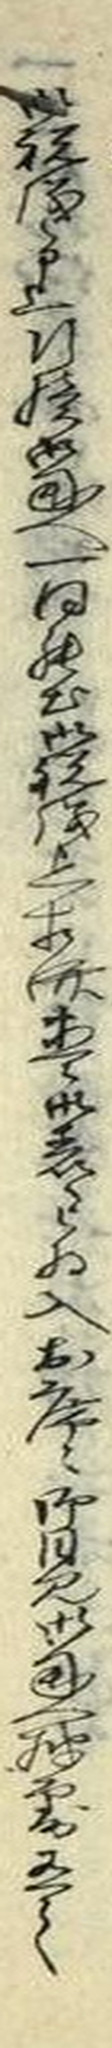御祝儀被申上引続御用人一同罷出御祝儀申上相済直ニ御表へ被為入於席々御目見御用人披露有之

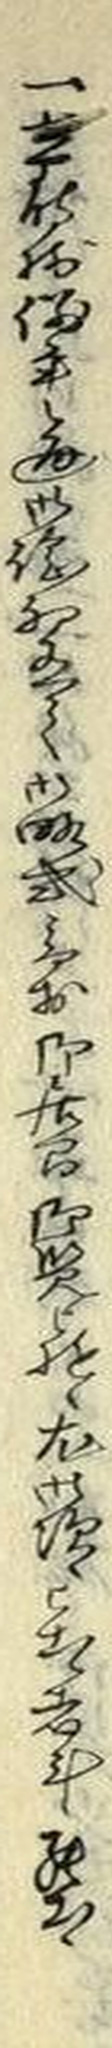一六半時揃例年之通御謡初有之御略式ニ而於御居間御覧被遊候尤御次へ被出候者斗罷出候
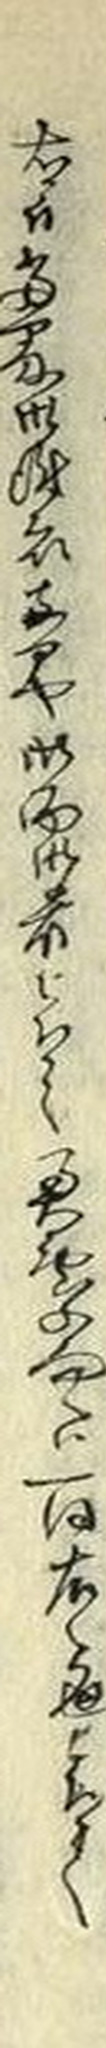右ニ付当番御附衆両部屋御酒御肴被下之奥台向ヘハ一同左之通被下之
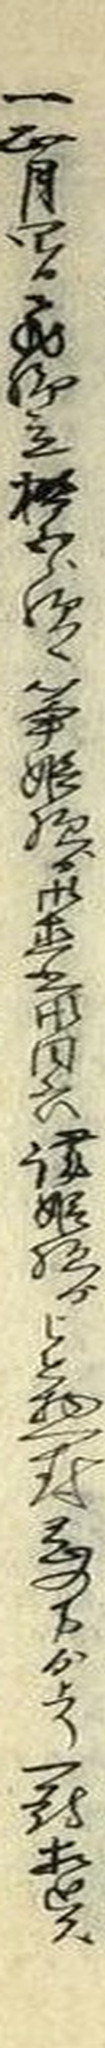一正月四日飛脚立楷五郎様へ箏姫様ゟ御直書御目六謹姫様ゟ被進物一対岡の方ゟ上り一対相廻ス
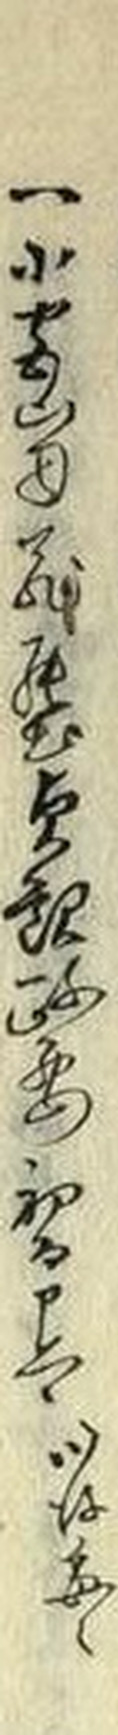一小宮山周蔵罷出貞観政要初而申上候以後毎々
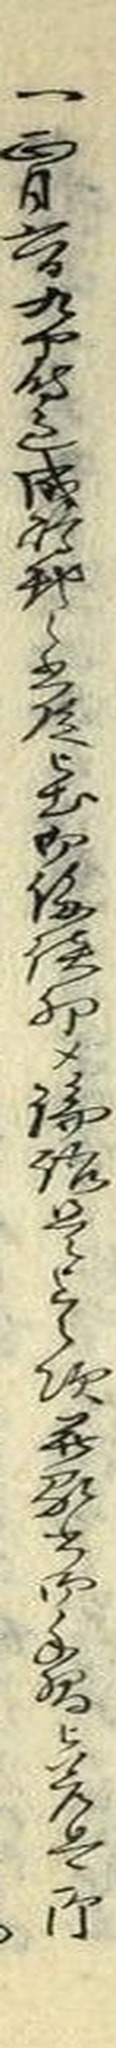一正月六日九半時過成嶋邦之丞殿被出御講談初メ論語是迄之次幷歌書御手習被差上候御
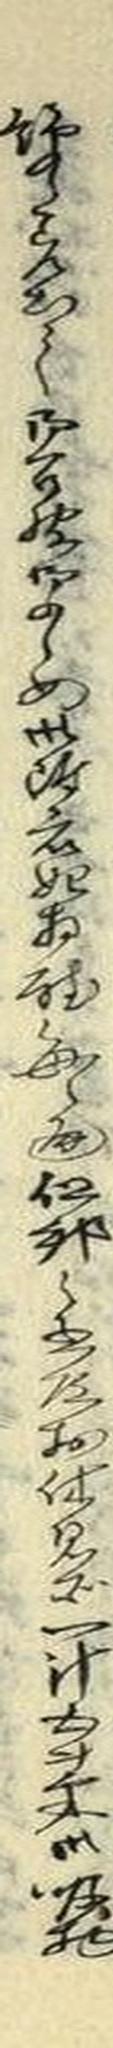飾のし差出之御召服御のしめ御付衆始拝聴毎之通但邦之丞殿於休息所一汁五菜御吸物
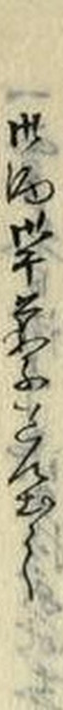御酒御干菓子差出之
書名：少傅日録抄（斉善付側向頭取日記、在府）
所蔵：福井県文書館 Fukui Prefectural Archives
